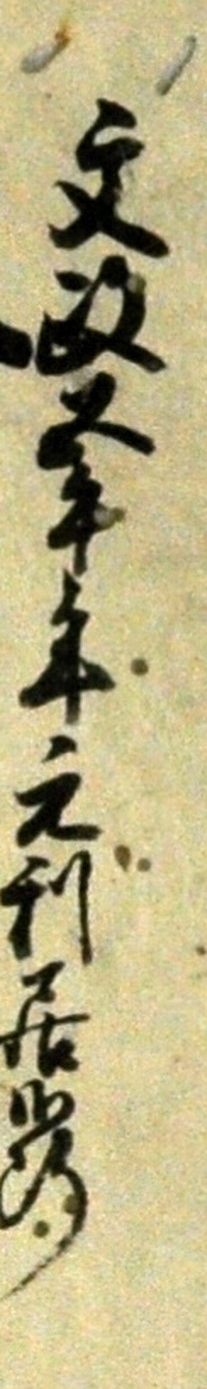文政五午年元利居御断
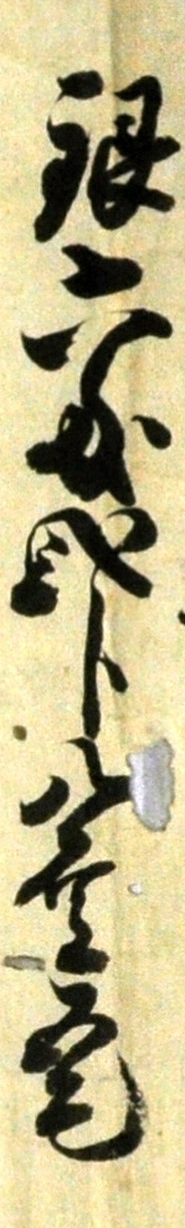銀六匁弐分八厘五毛
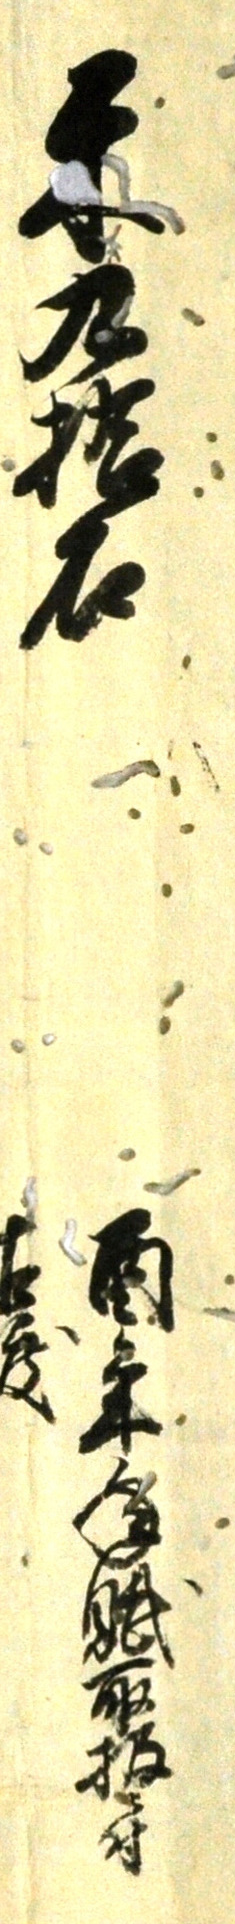米九拾石酉年年賦取扱ニ付
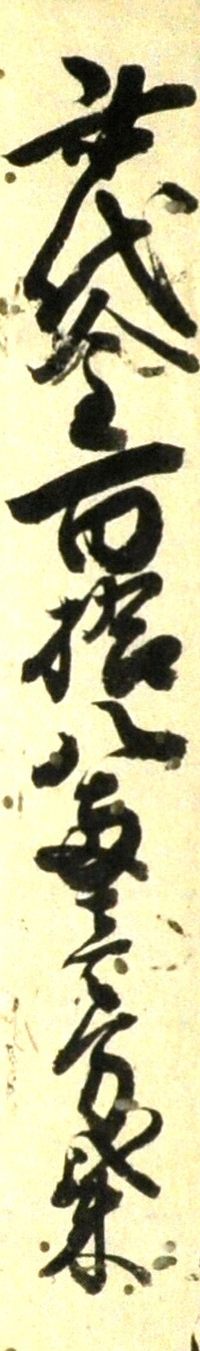此代金百拾八両壱分弐朱
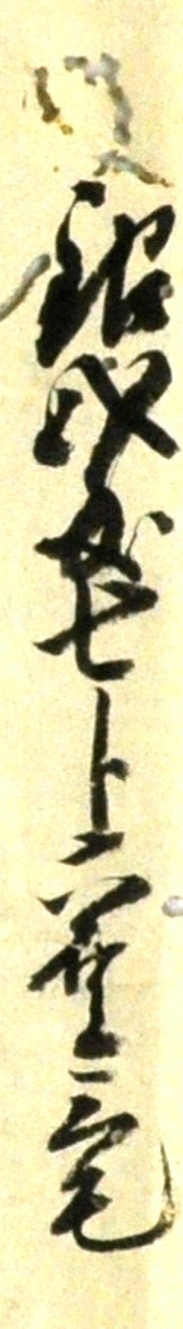銀弐匁七分六厘三毛
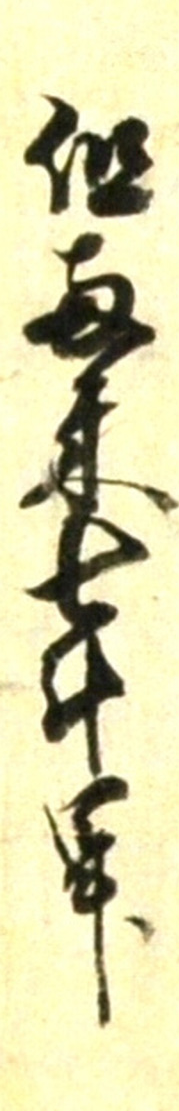但両米七斗四升
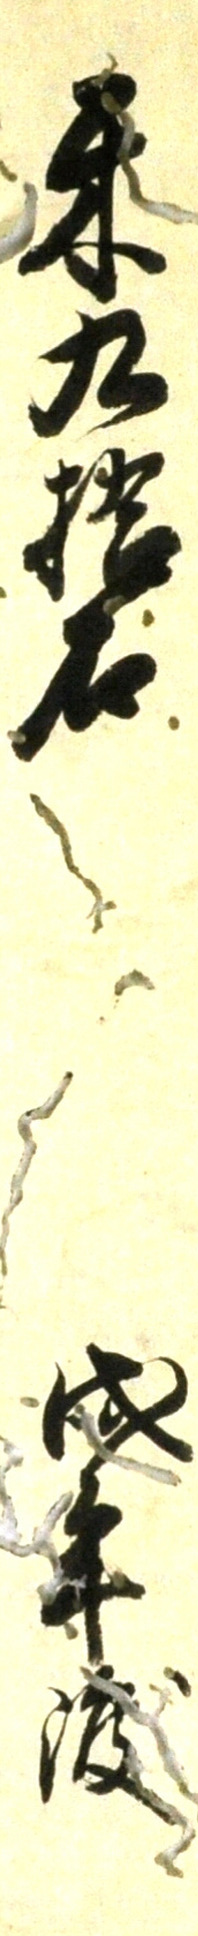米九拾石戌年渡
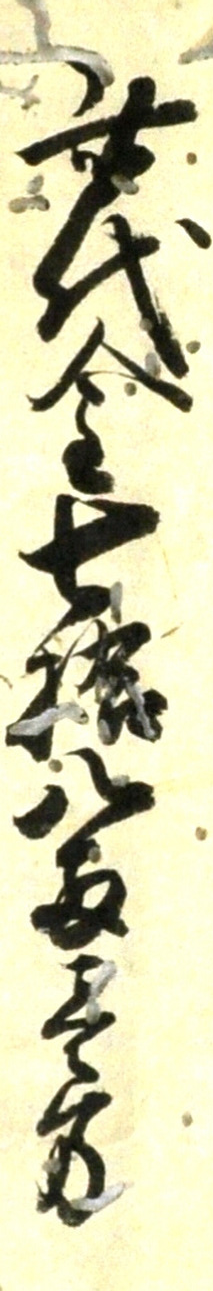此代金七拾八両壱分
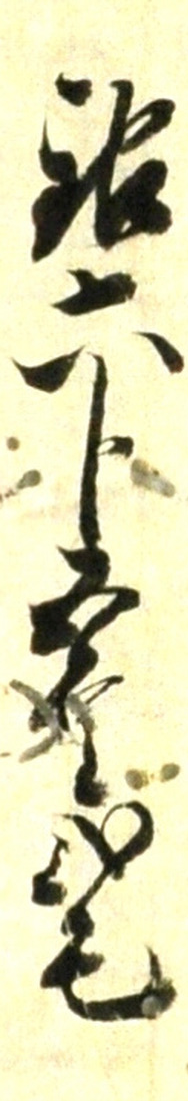銀六分五厘弐毛
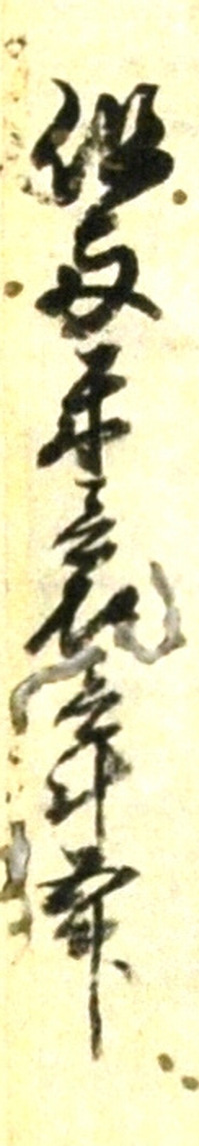但両米壱石壱斗五升
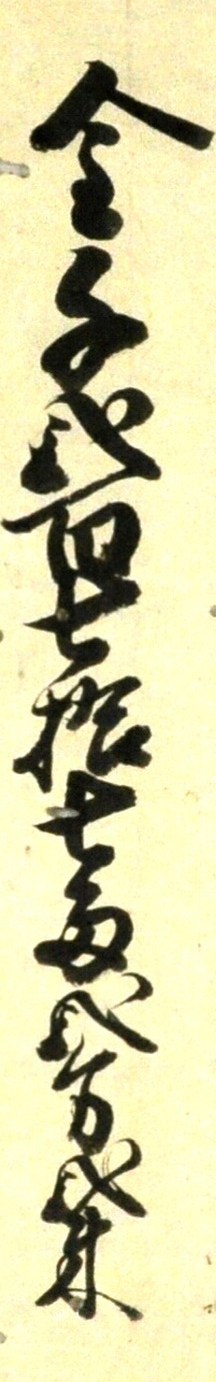金千弐百七拾七両弐分弐朱
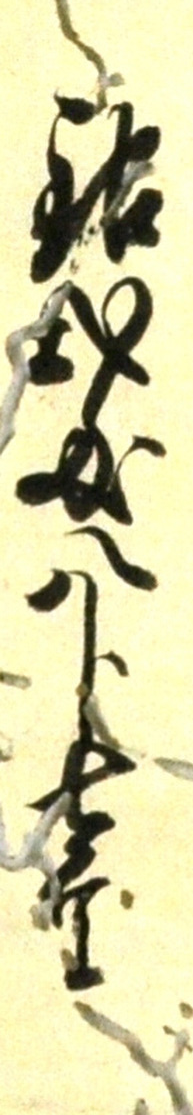銀弐匁八分七厘
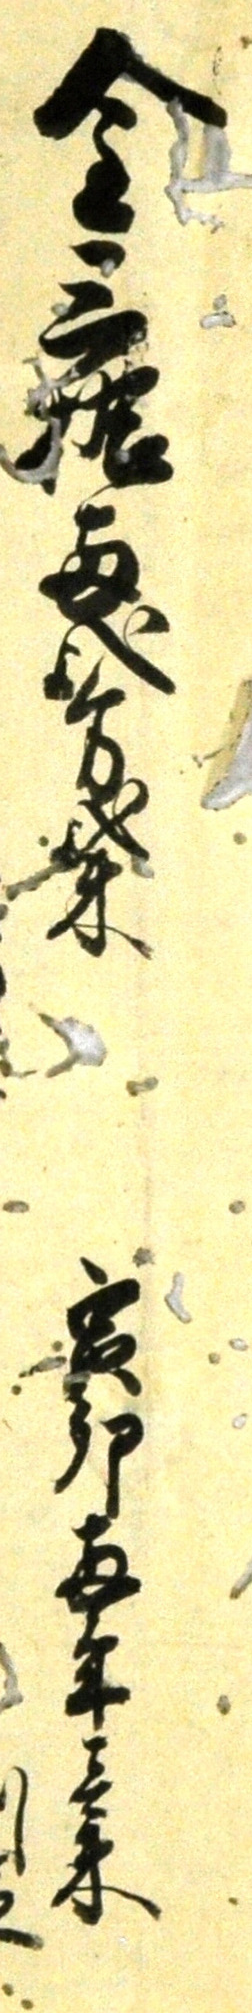金三拾両弐分弐朱寅卯両年壱朱
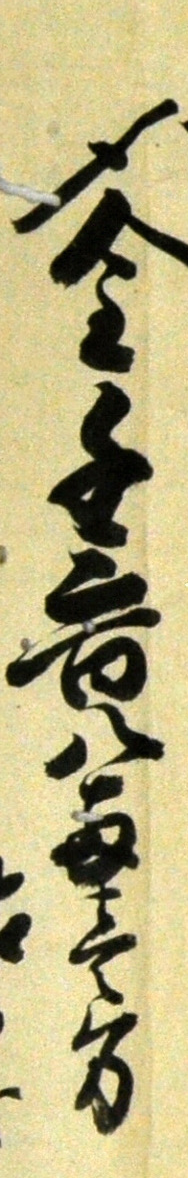〆千三百八両壱分
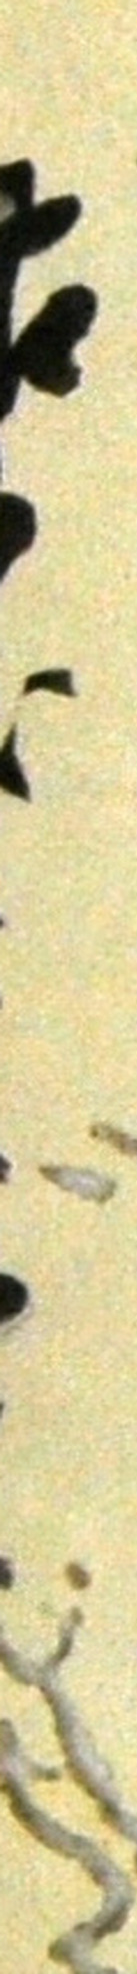銀五匁壱分五厘

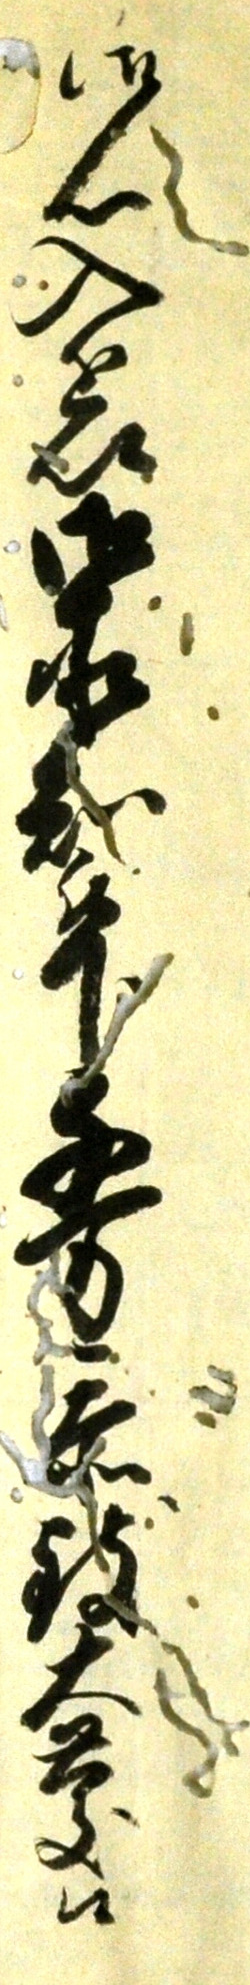御心入を以御承知被下千万忝致大慶候
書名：覚
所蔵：伊那市立高遠町図書館・合同会社AMANE
